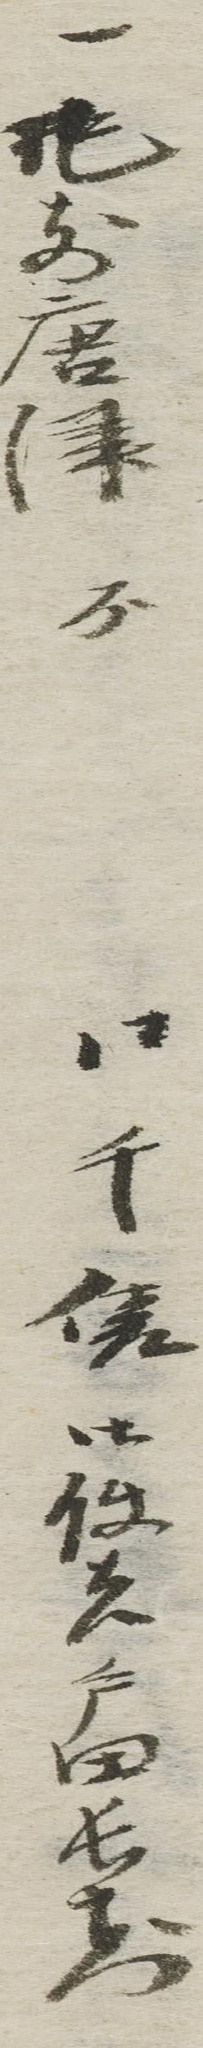一肥前唐津ゟ同千俵御使者戸田長右衛門
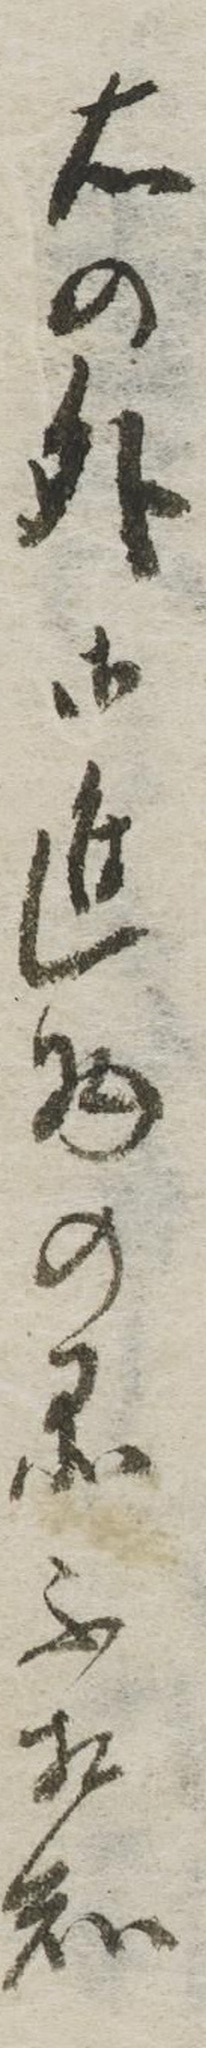右の外御進物の品不相知
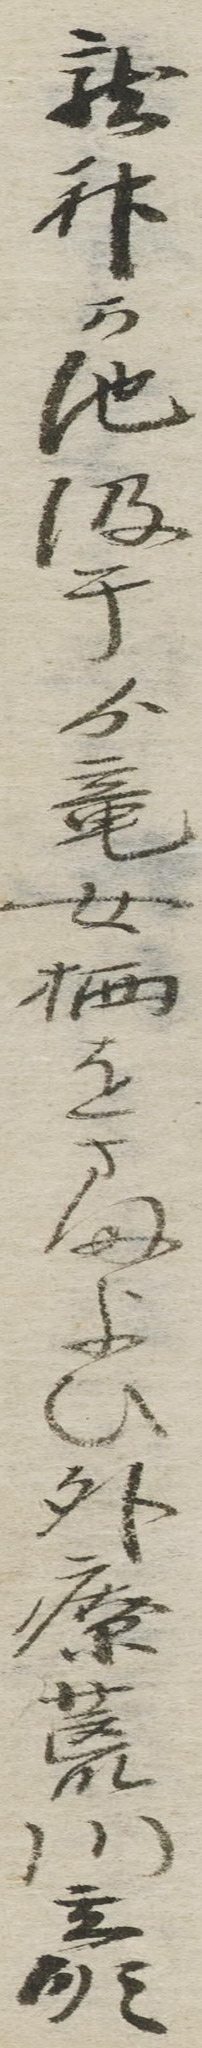龍神か池汲干ゟ竜女栖をさまよひ外療荒川玄順

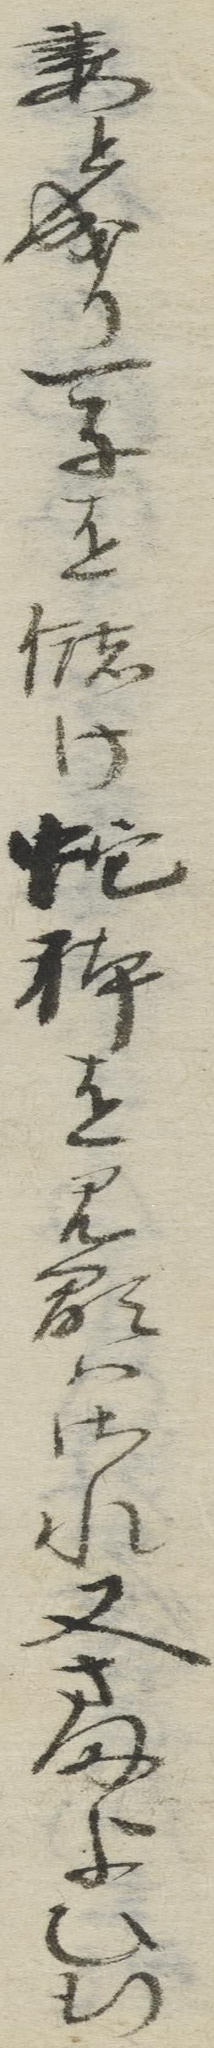妻と成り一子を儲け蛇体を見顕ハされ又さまよひ行
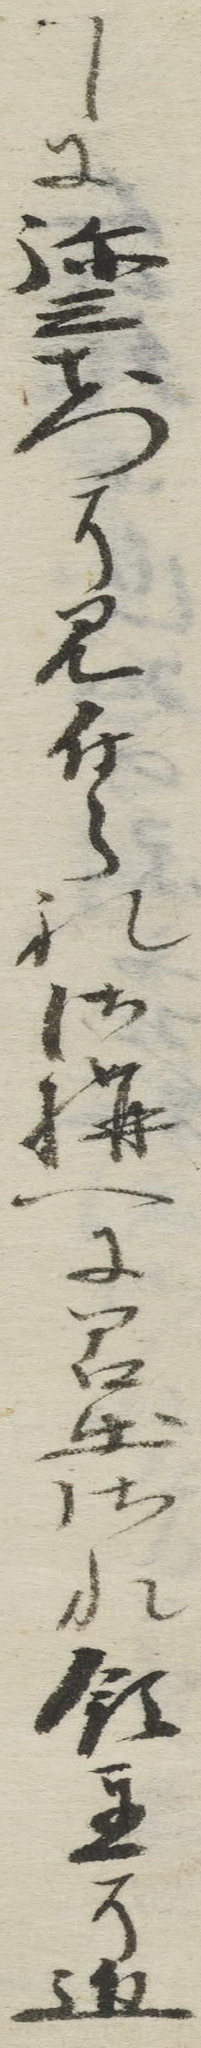しに弥三右衛門に見付られ御構へに召出され領主に近
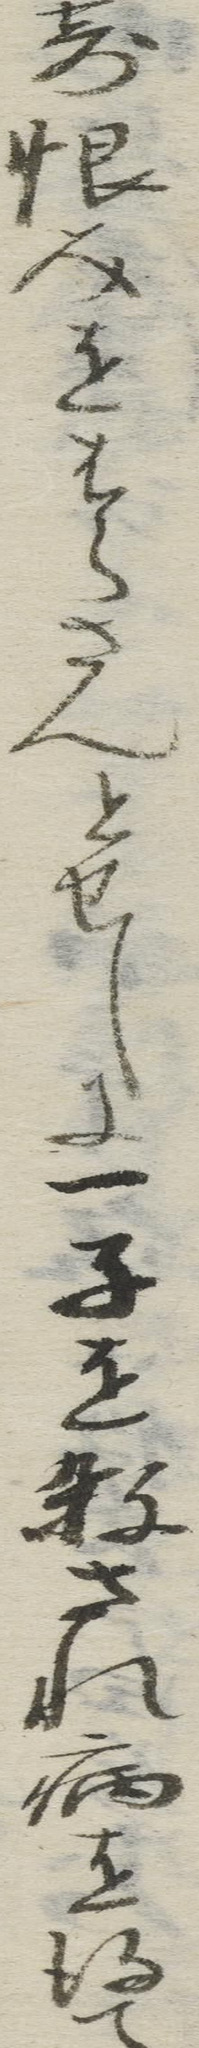寄恨みをはらさんとセしに一子を殺され病を得て
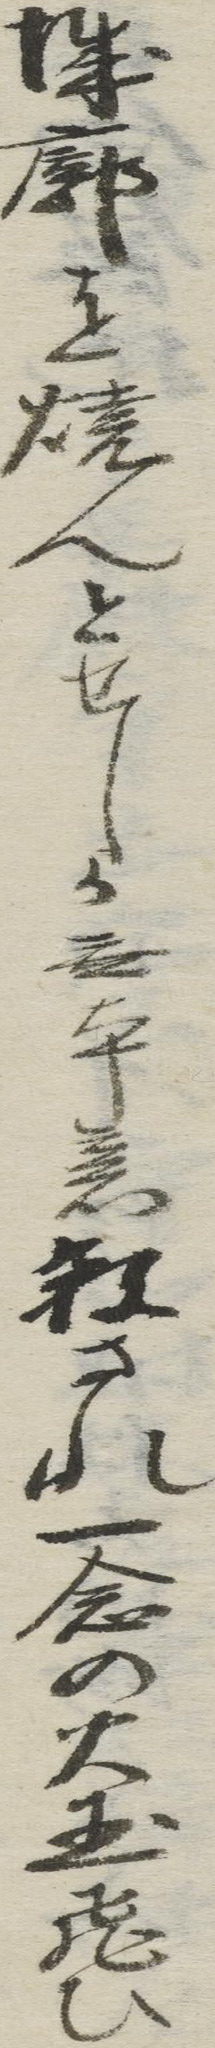城郭を焼んとセしか無本意殺され一念の火玉飛ひ
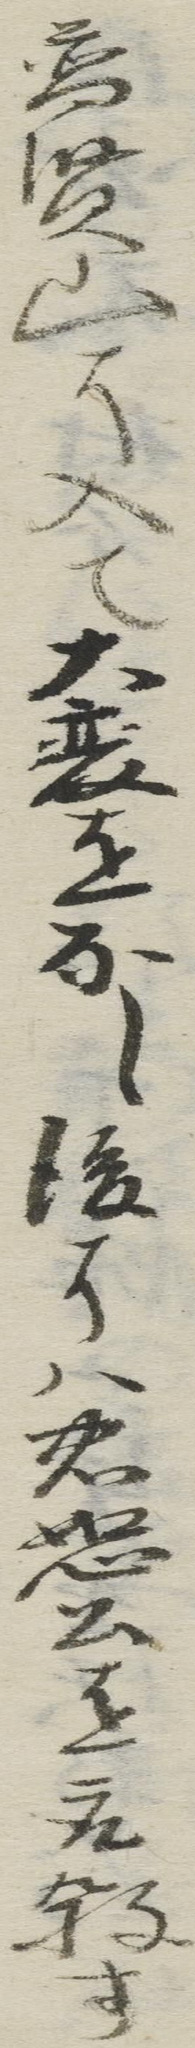普賢山に入て大変をなし後にハ忠恕公を取殺す
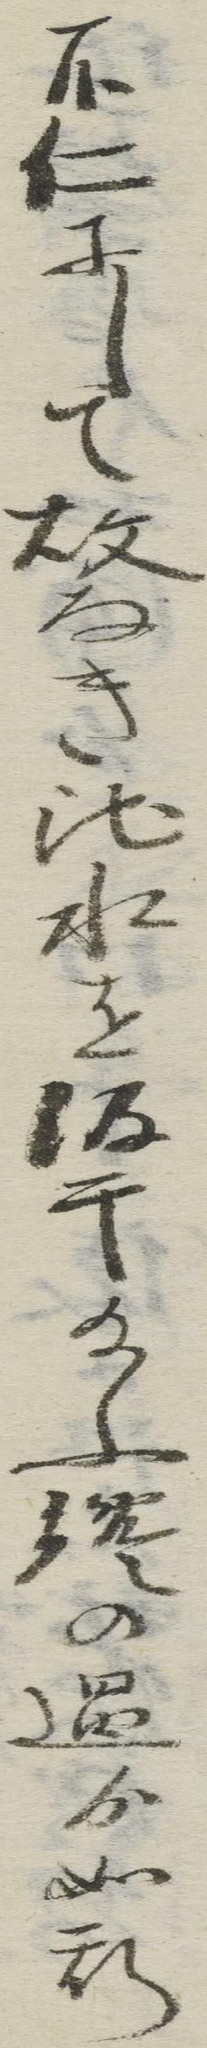不仁にして故なき池水を汲干給ふ纔の過ゟ如斯
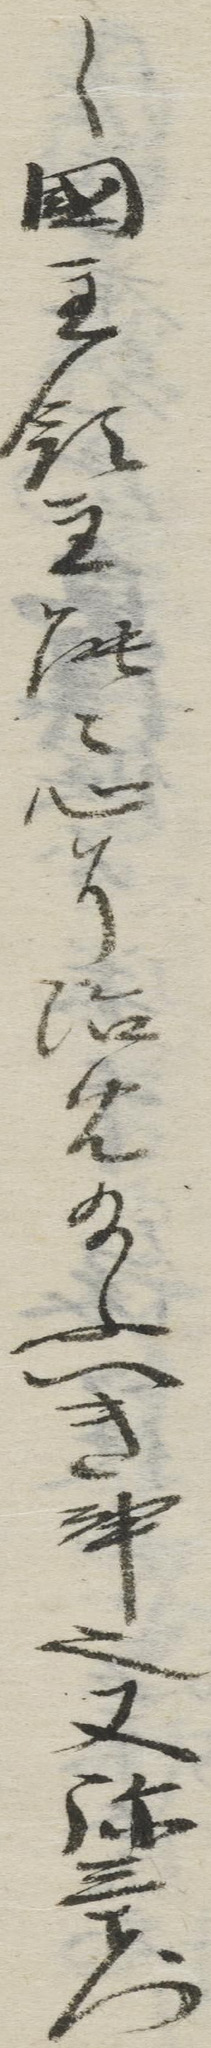く国主領主能〻心に治め給ふへき事也又弥三右衛門
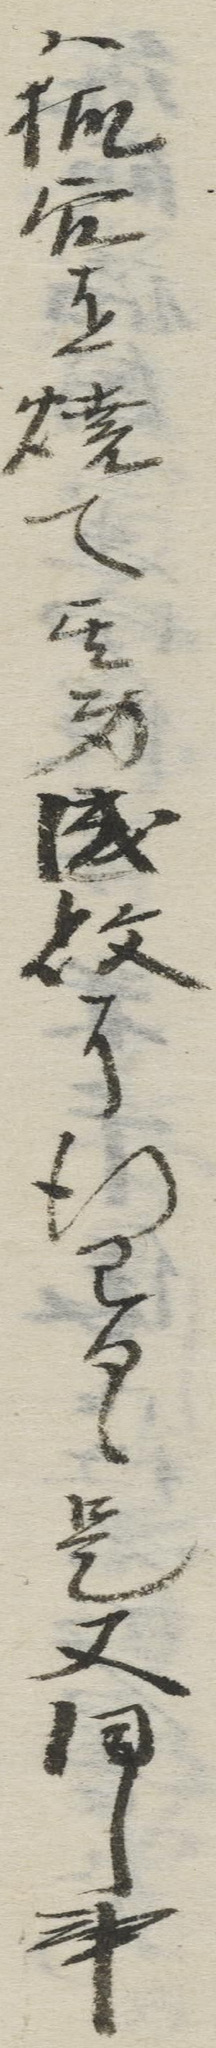ハ狐穴を焼て其身成敗に行わるゝ是又同し事
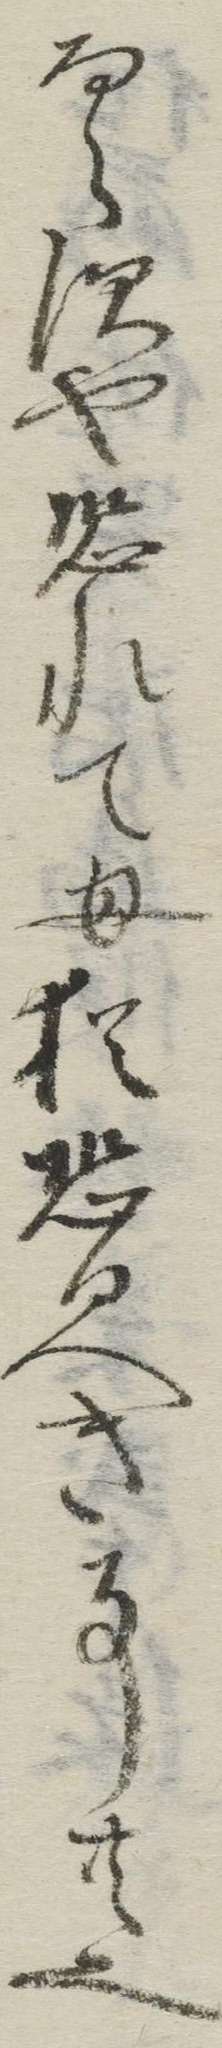ならすや恐れても猶恐るへき事共也
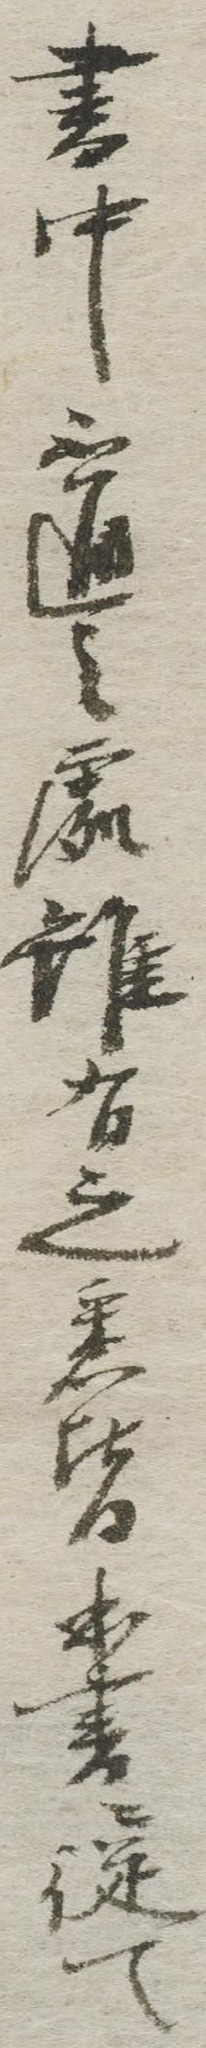書中不通之処雖有之悉皆本書ニ従て
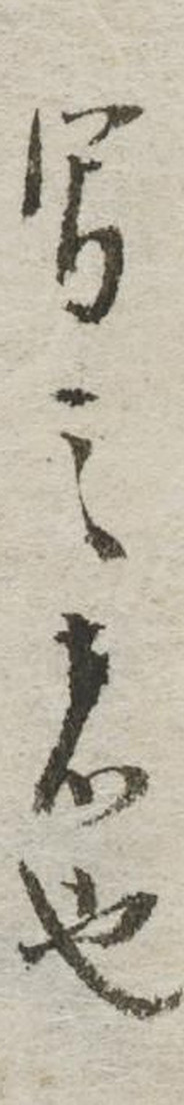写之者也
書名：肥前國島原領普賢山大変記　完
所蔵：東京大学地震研究所図書室 Earthquake Research Institute Library, The University of Tokyo, JAPAN
